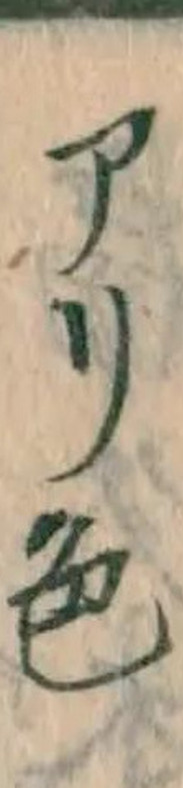アリ色
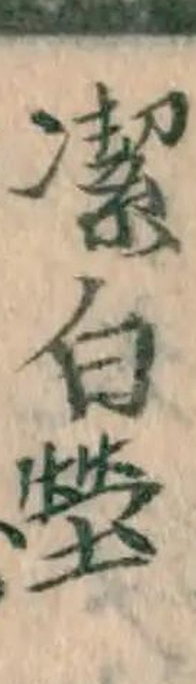潔白塋
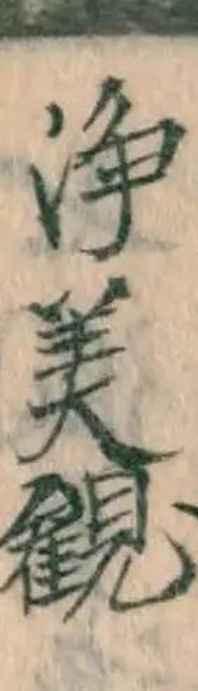浄美観
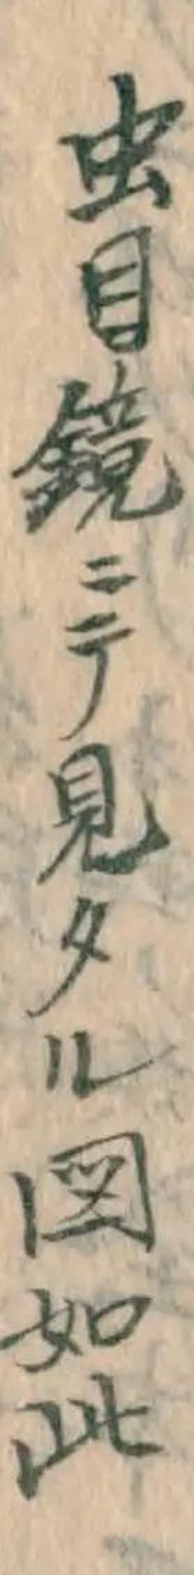虫目鏡ニテ見タル図如此

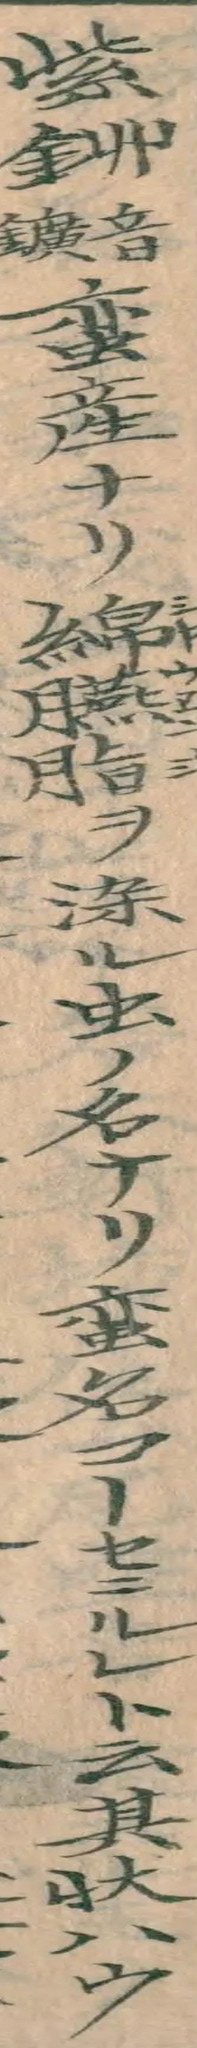紫𨥥音鑛蛮産ナリ綿臙脂ヲ染ル虫ノ名ナリ蛮名コーセニルレト云其状ハウ
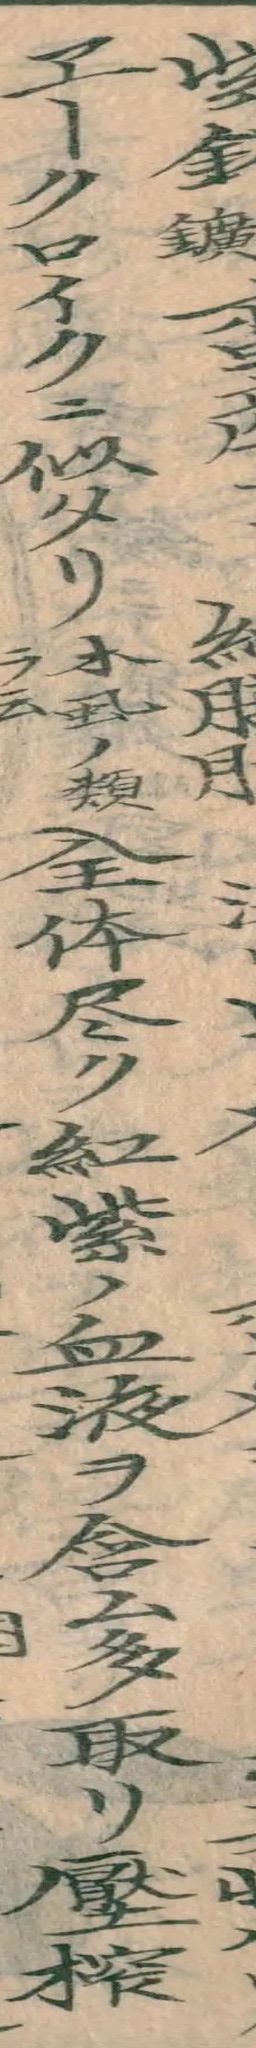ヱークロイクニ似タリ木虱の類ヲ云全体尽ク紅紫ノ血液ヲ含ム多取リ壓榨
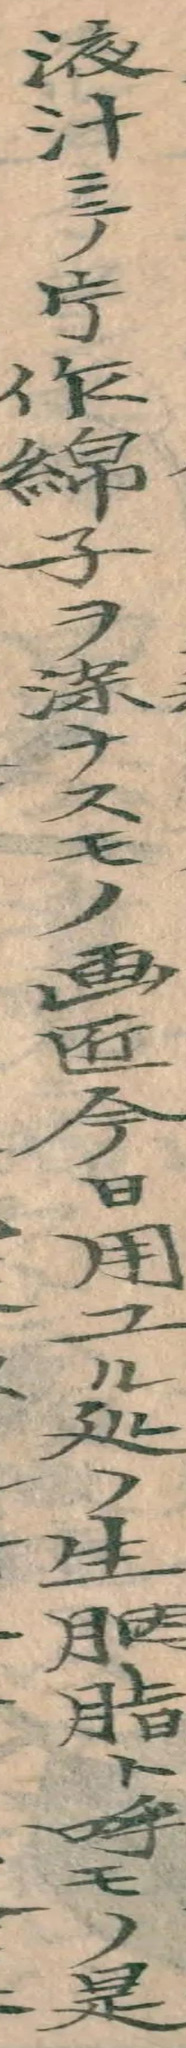液汁ニテ片作綿子ヲ染ナスモノ画匠今日用ユル処ノ生胭脂ト呼モノ是
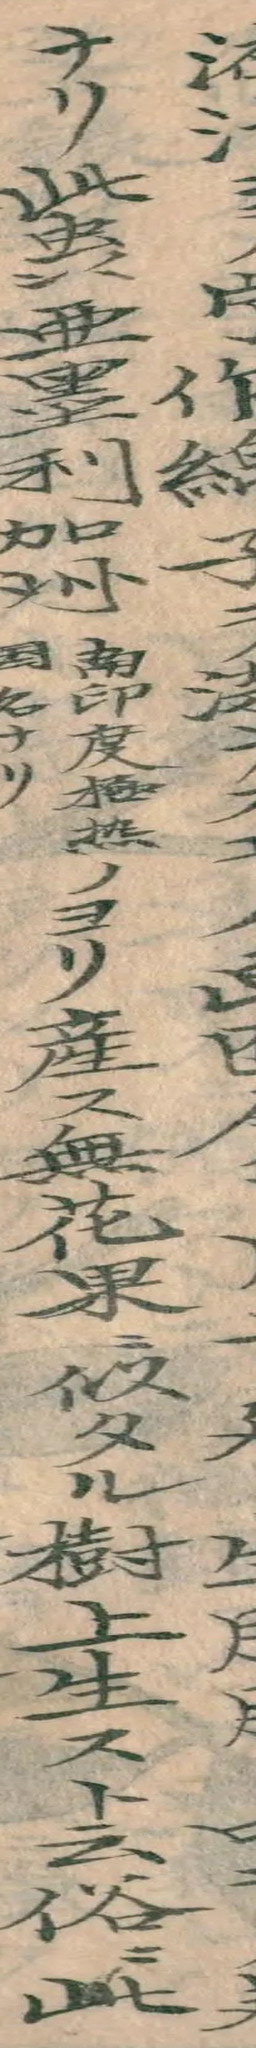ナリ此虫亜墨利加州南印度極熱ノ国名ナリヨリ産ス無花果ニ似タル樹上生スト云俗ニ此
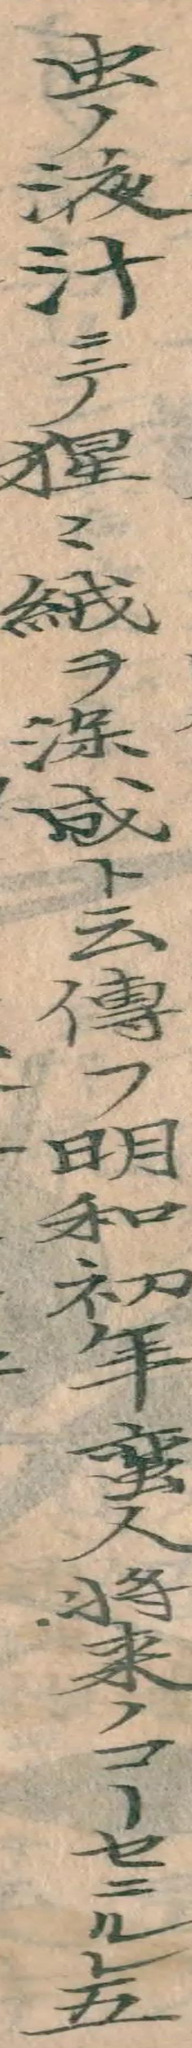虫ノ液汁ニテ猩々絨ヲ染成ト云伝フ明和初年蛮人将来ノコーセニルレ五
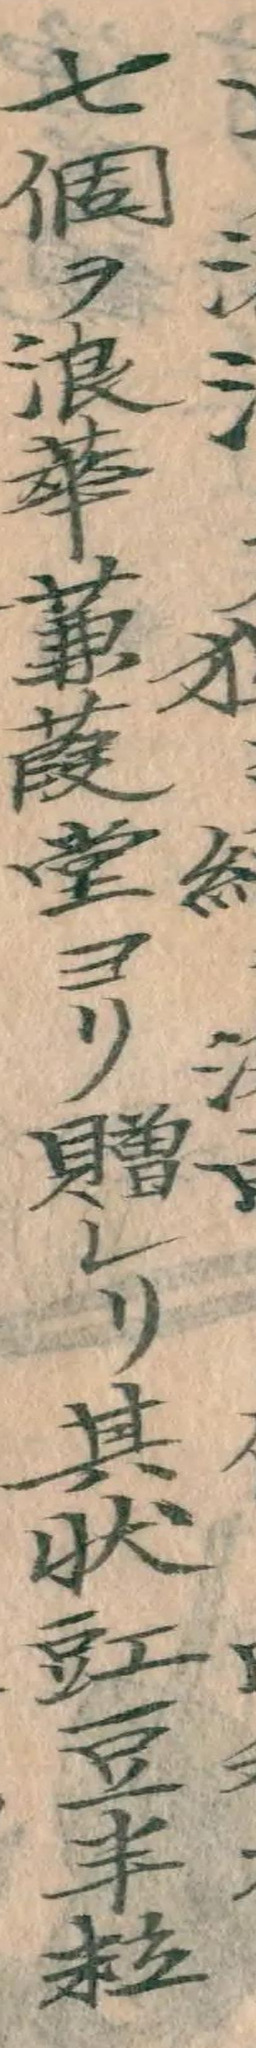七個ヲ浪華蒹葮堂ヨリ贈レリ其状豇豆半粒
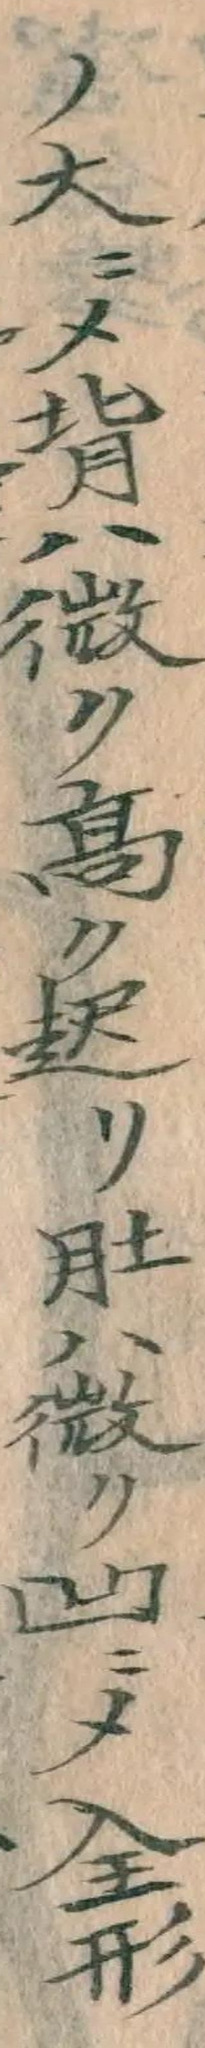ノ大ニシテ背ハ微ク高ク起リ肚ハ微ク凹ニシテ全形
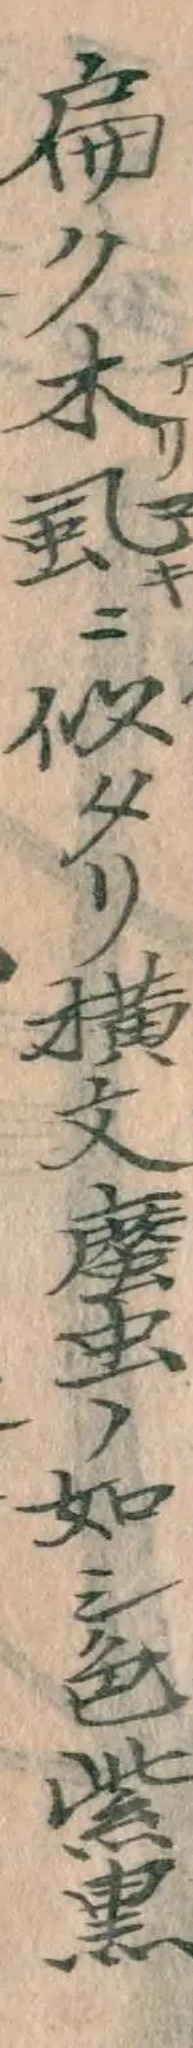扁ク木虱ニ似タリ横文䗪虫ノ如シ色紫黒
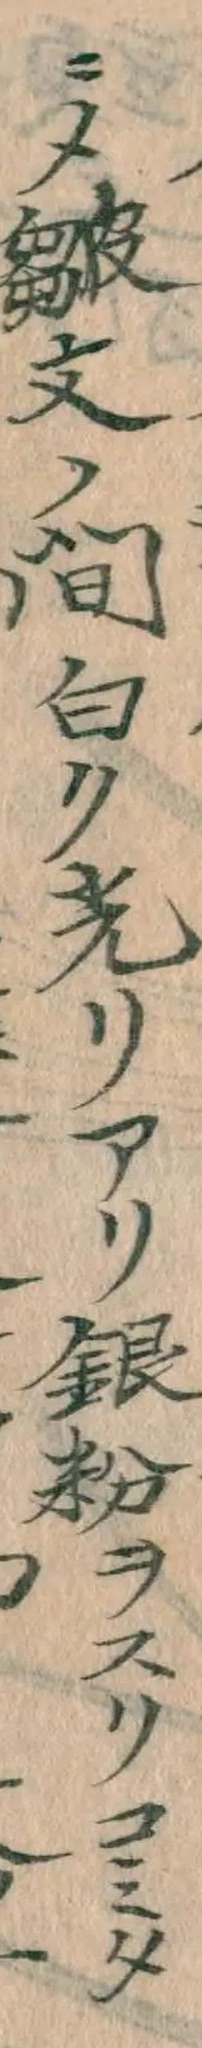ニシテ皺文ノ間白ク光リアリ銀粉ヲスリコミタ
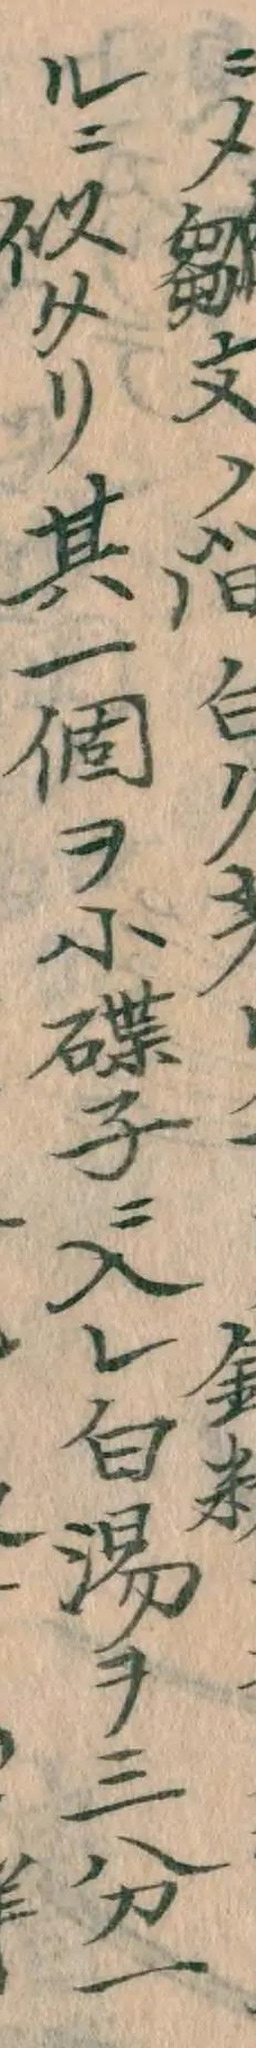ルニ似タリ其一個ヲ小碟子ニ入レ白湯ヲ三分一
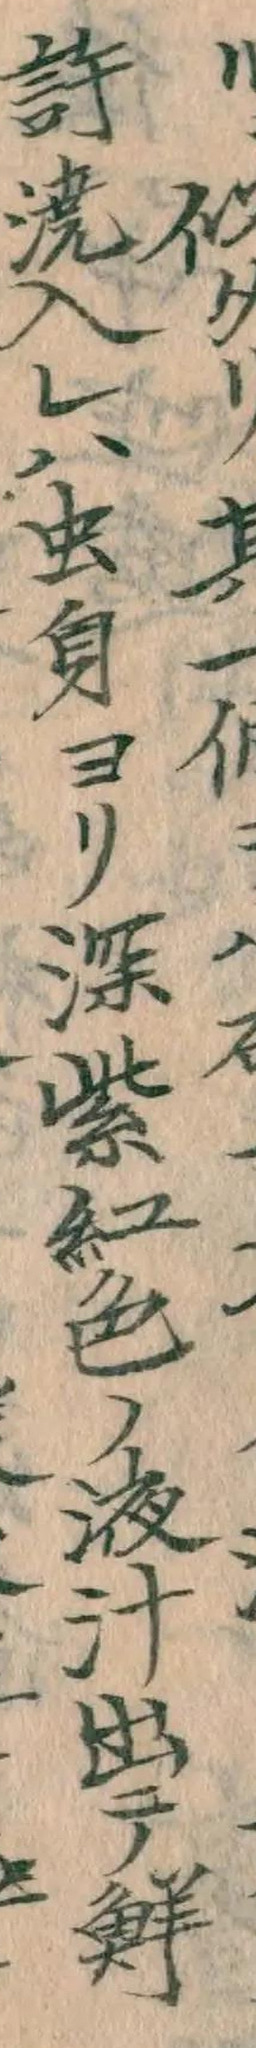許澆入レハ虫身ヨリ深紫紅色ノ液汁出テ鮮
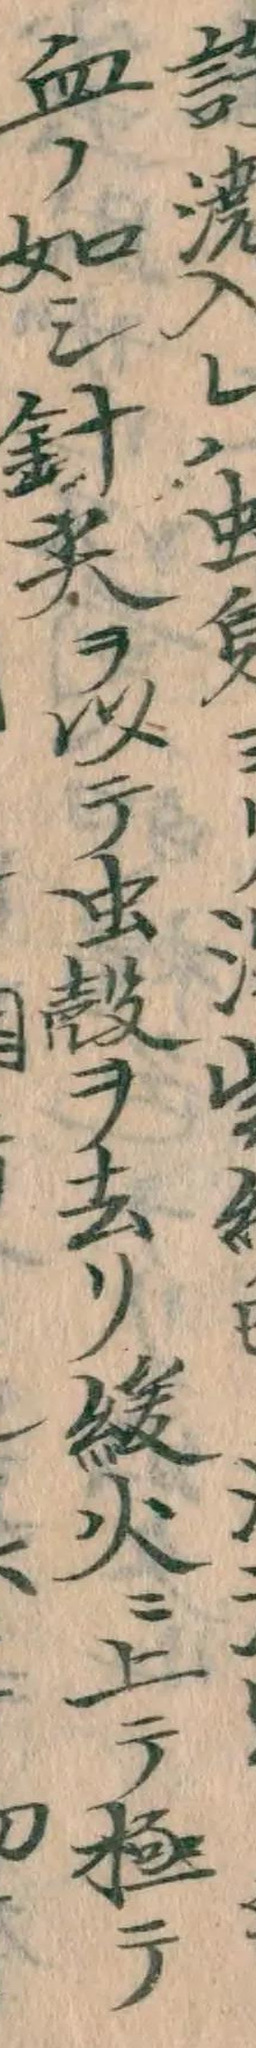血ノ如シ針尖ヲ以テ虫殻ヲ去リ緩火ニ上テ極テ
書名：千蟲譜 3巻. [3]
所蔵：国立国会図書館 National Diet Library, JAPAN
